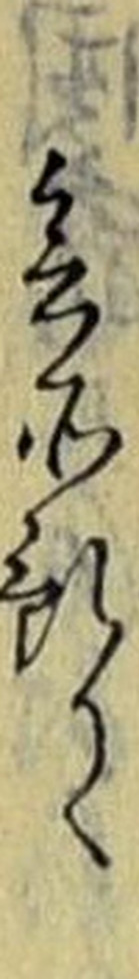会所預りへ
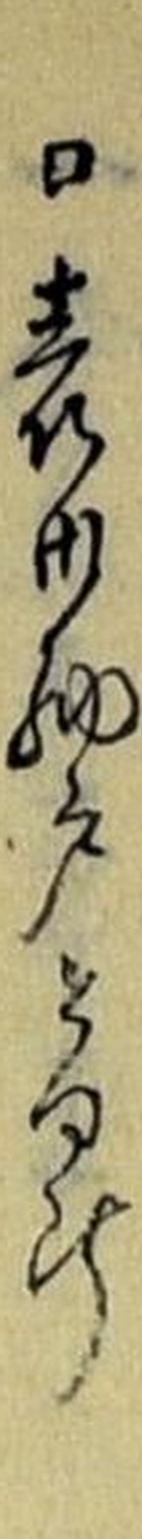○表御納戸と同断
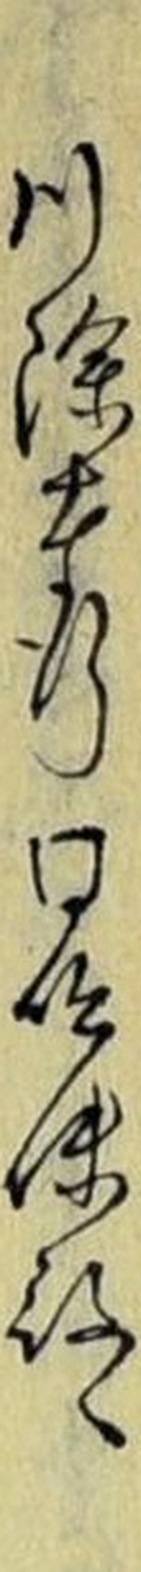川除奉行同吟味役へ
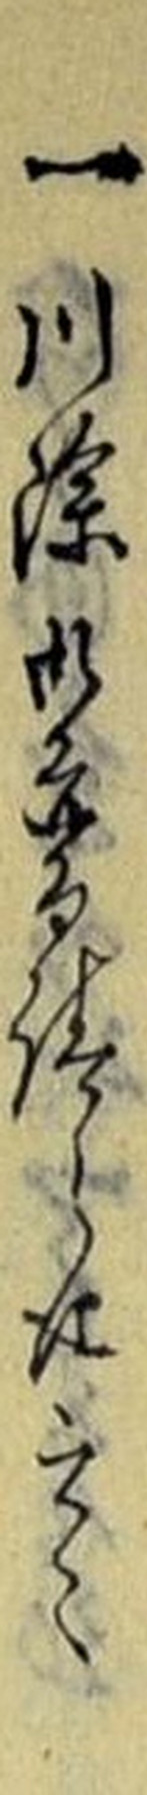一川除御普請之儀云々
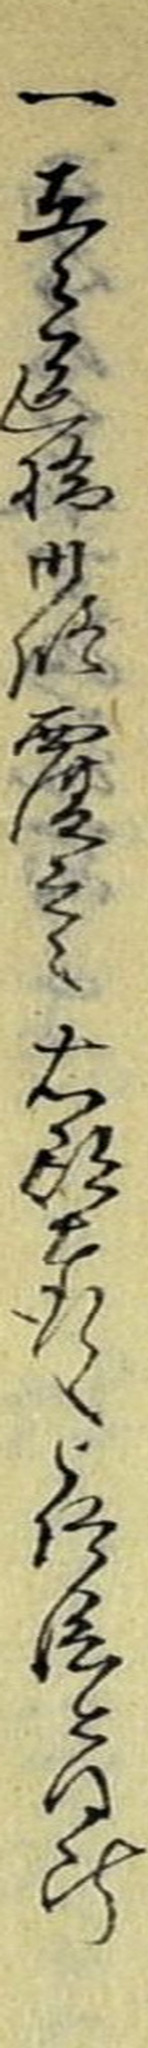一在々道橋御修覆云々右郡奉行へ被仰渡と同断
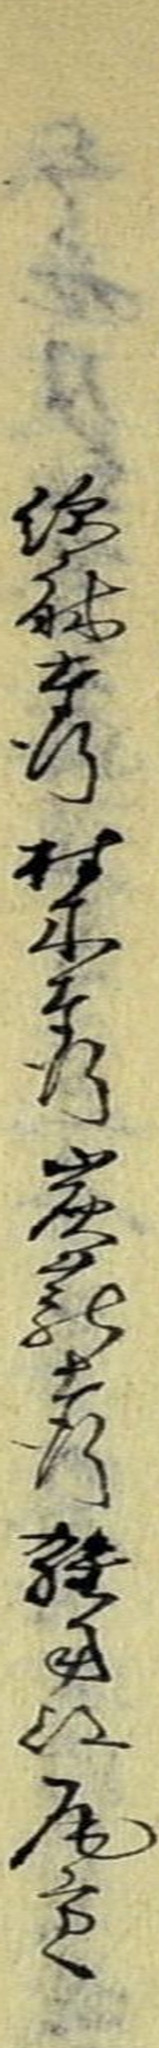綿麻奉行材木奉行炭薪奉行雑用役瓦方へ
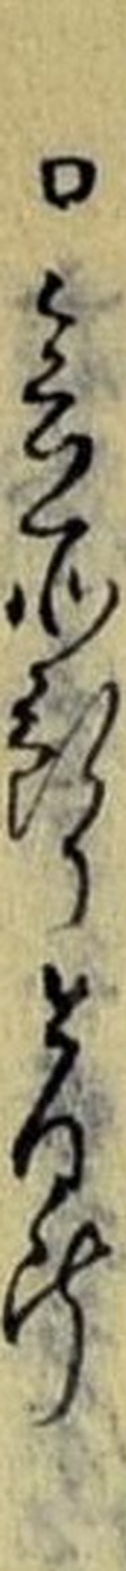○会所預りと同断
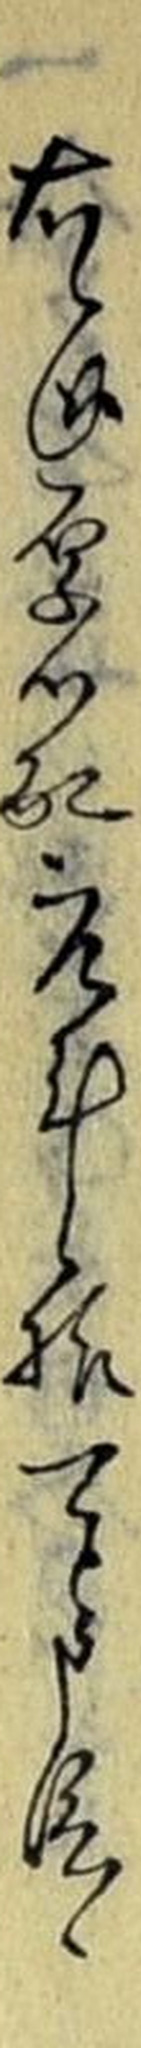右趣厚心配取斗候様可被申渡候
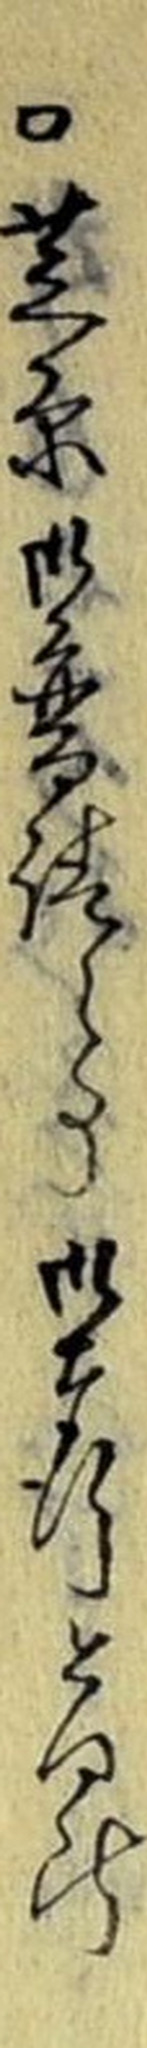○芝原御普請之事御奉行と同断
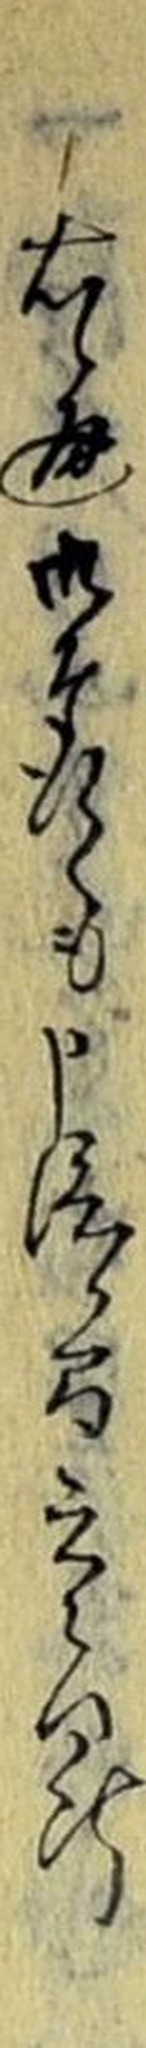右之通御奉行へも申渡候間云々同断
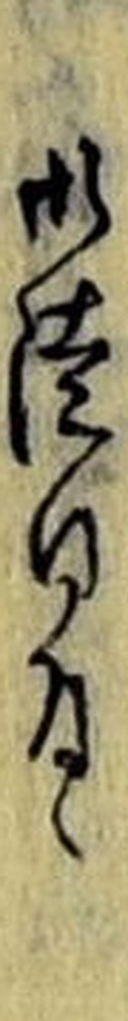御徒目付へ
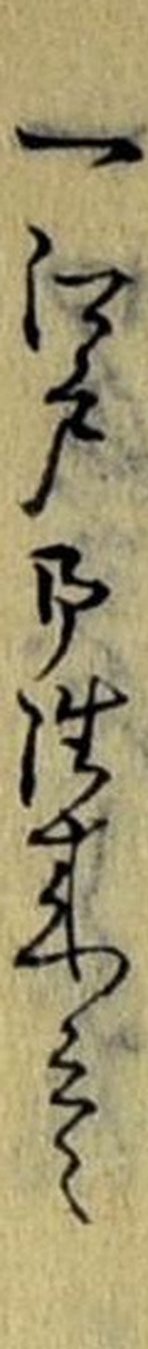一江戸御往来云々

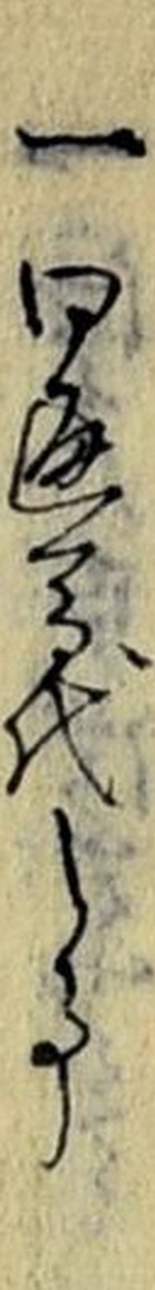一同通馬代之事
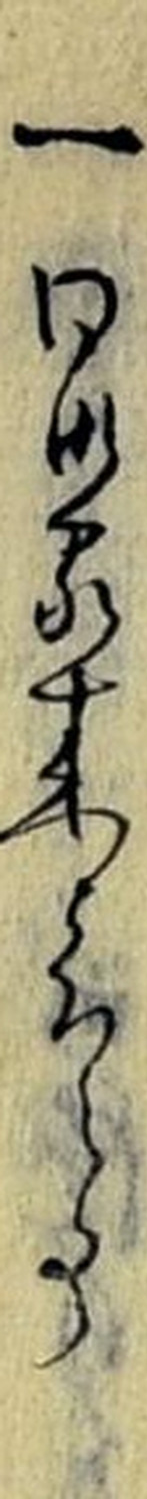一同御家来被下候事
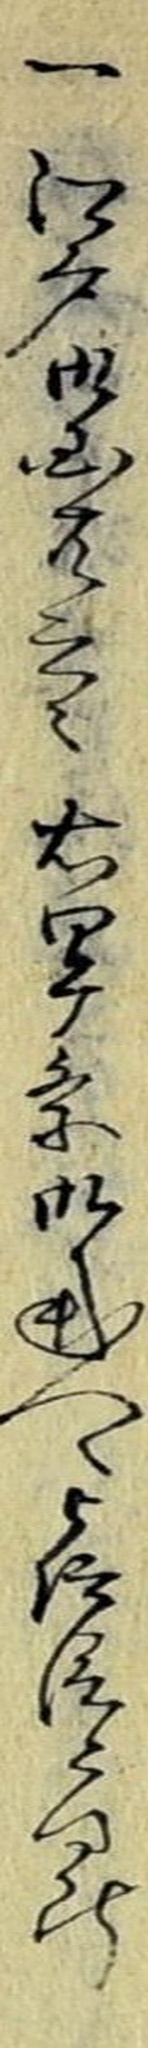一江戸御国共云々右四ヶ条御用人へ被仰渡と同断
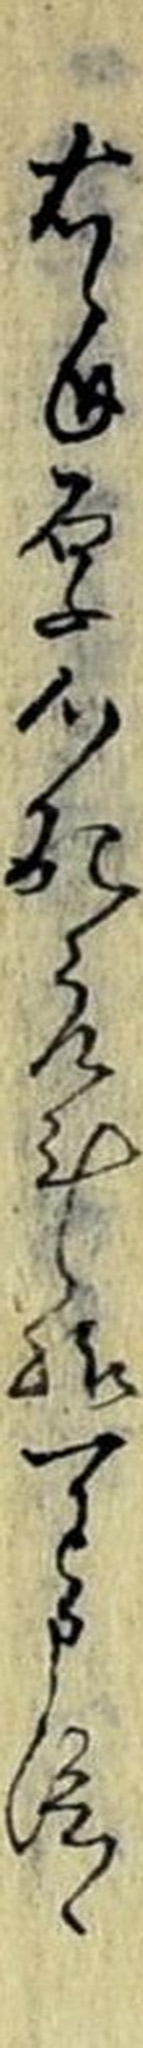右之趣厚心配取斗候様可被申渡候
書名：命令之部 四
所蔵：福井県文書館 Fukui Prefectural Archives
